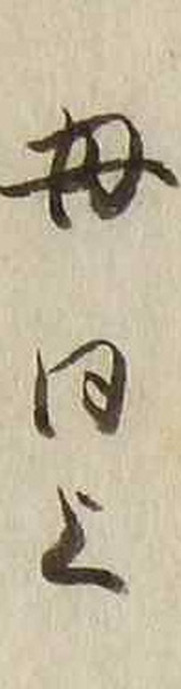母同上
